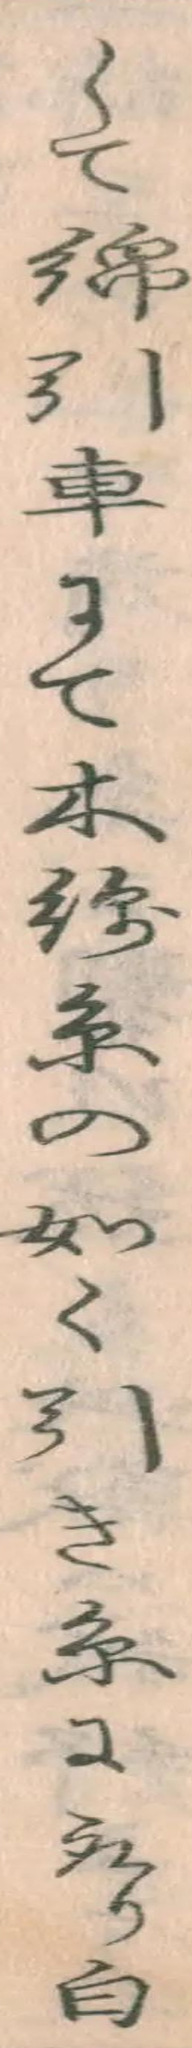して綿引車にて木綿糸の如く引き糸に取り白
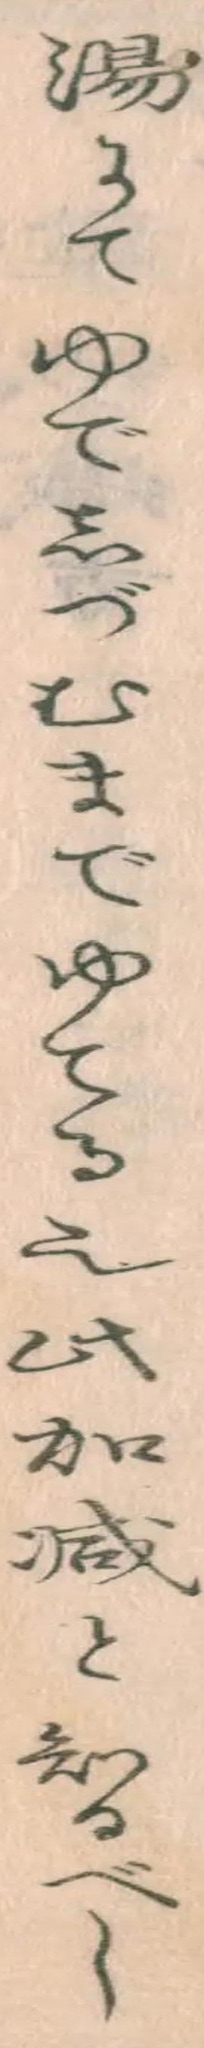湯にてゆでしづむまでゆてる也此加減と知るべし
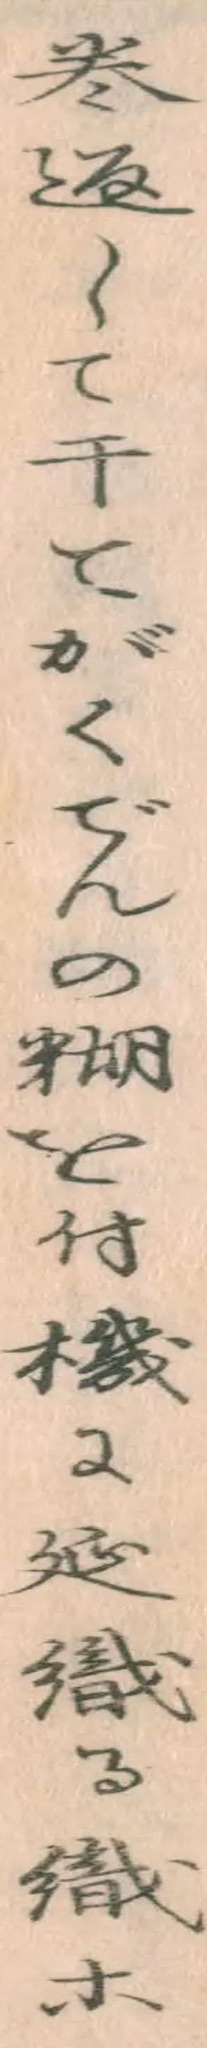巻返して干てがくでんの糊を付機に延織る織こ
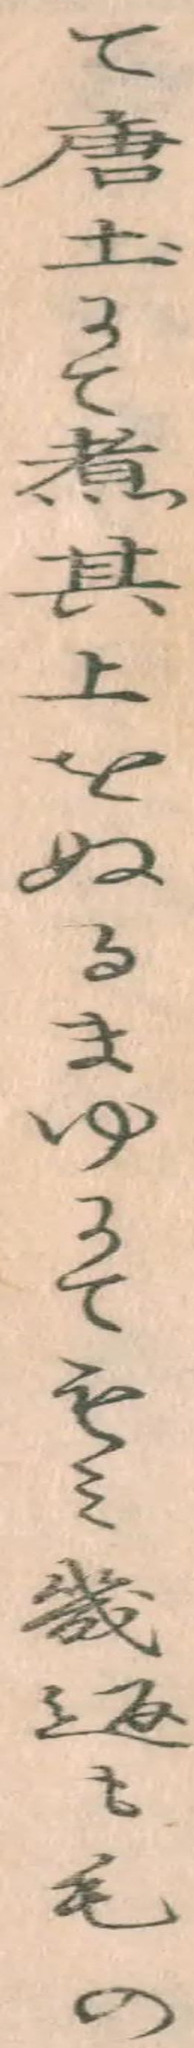て唐土にて煮其上をぬるまゆにてもみ幾返も毛の
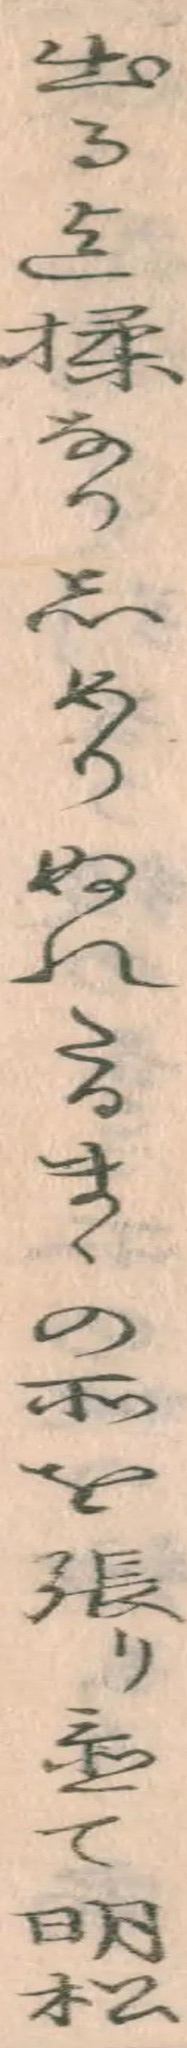出る迄揉なりしめりぬれたるまゝの所を張り置て明松
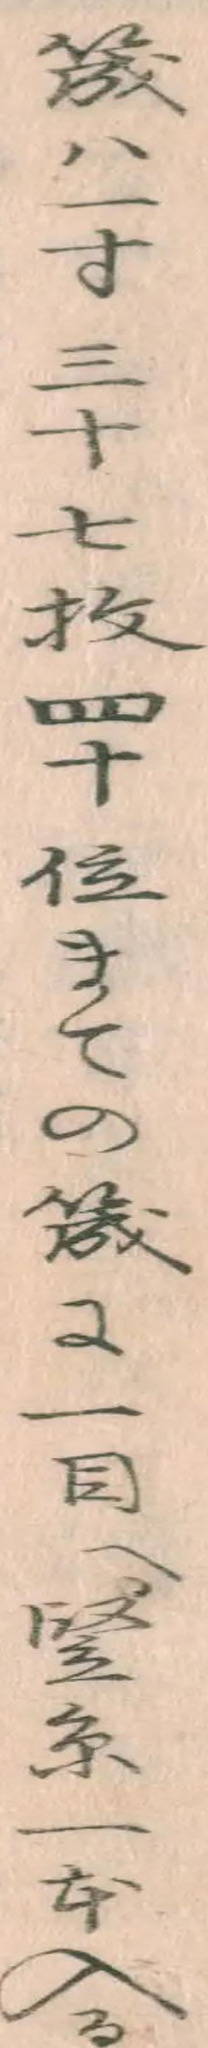一筬は一寸三十七枚四十位まての筬に一目へ竪糸一本入る
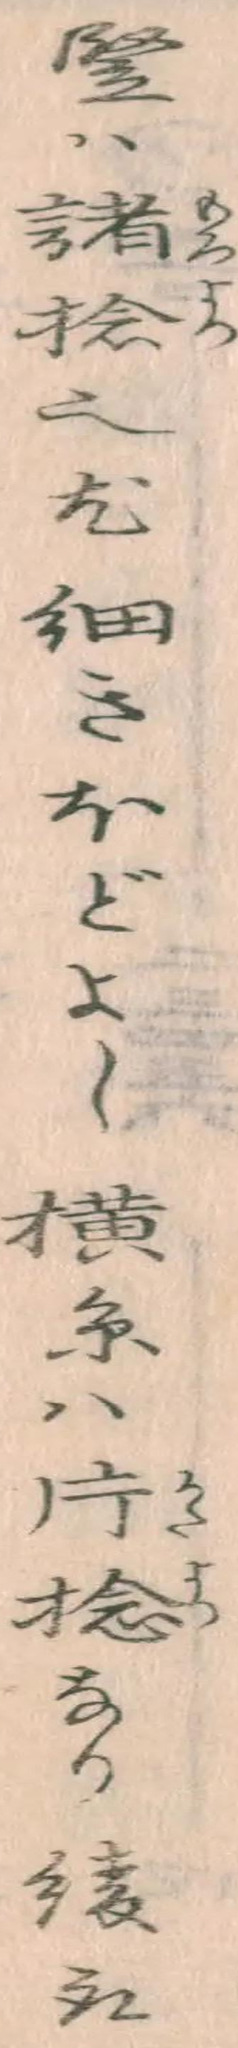竪は諸捻也尤細きほどよし横糸は片捻なり綾取
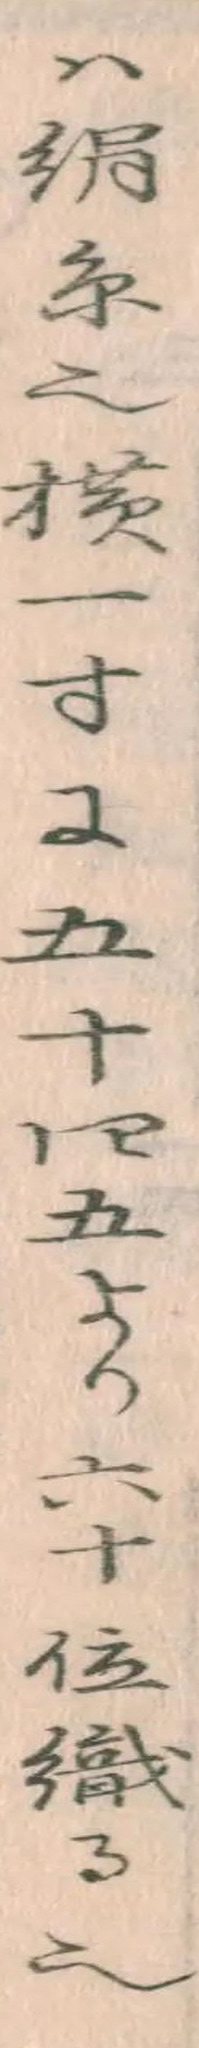は絹糸也横一寸に五十四五より六十位織る也
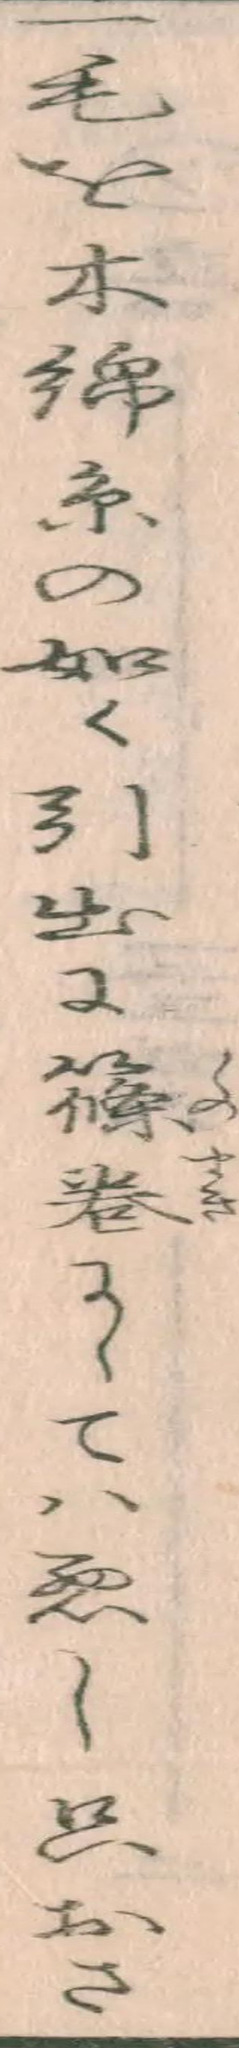一毛を木綿糸の如く引出に篠巻にしては悪し只おさ
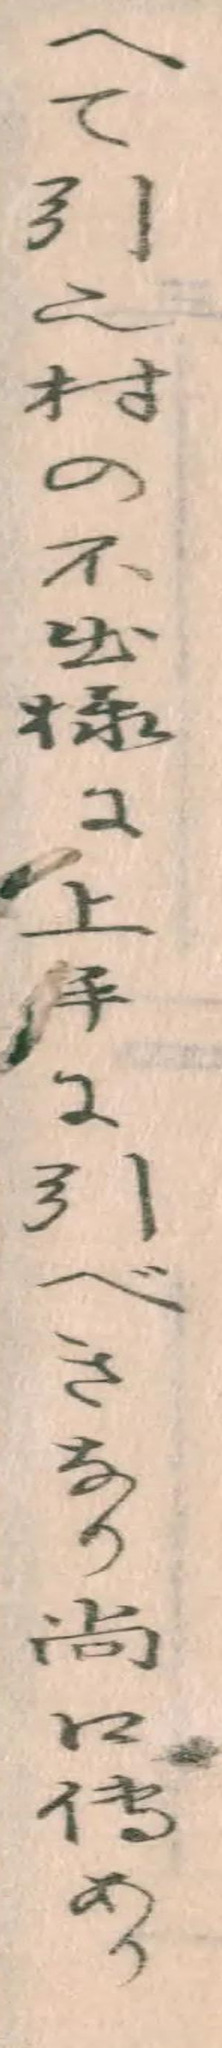へて引也村の不出様に上手に引べきなり尚口伝あり
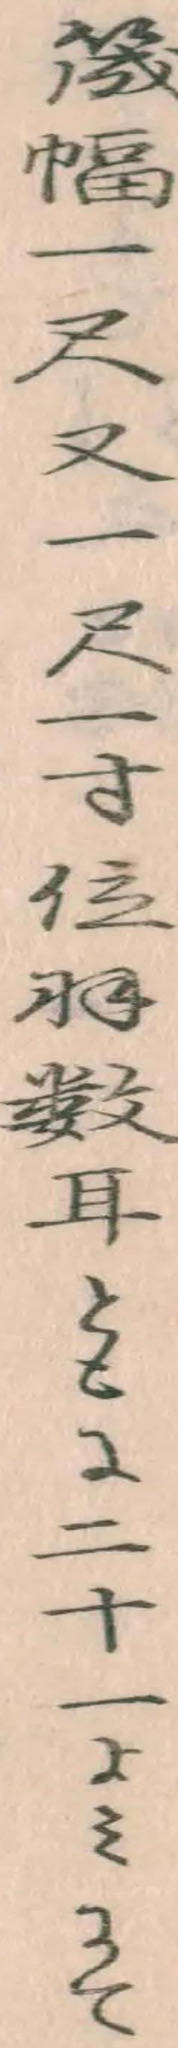一筬幅一尺又一尺一寸位羽数耳ともに二十一よみにて
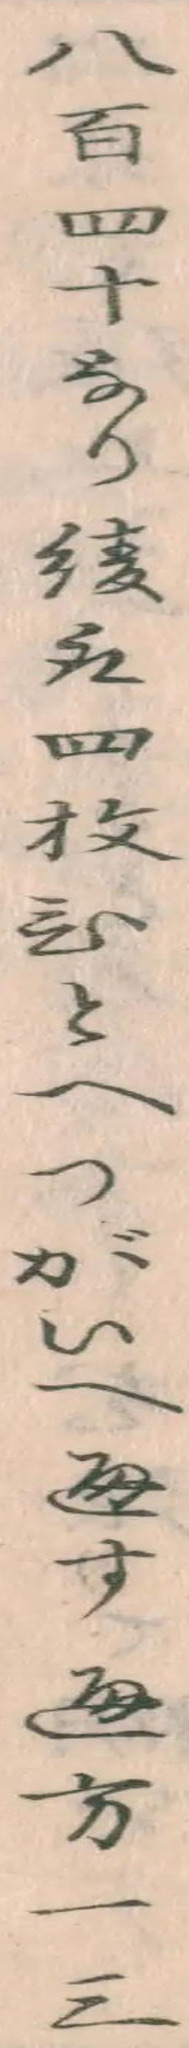八百四十なり綾取四枚ひとへつがいへ通す通方一三
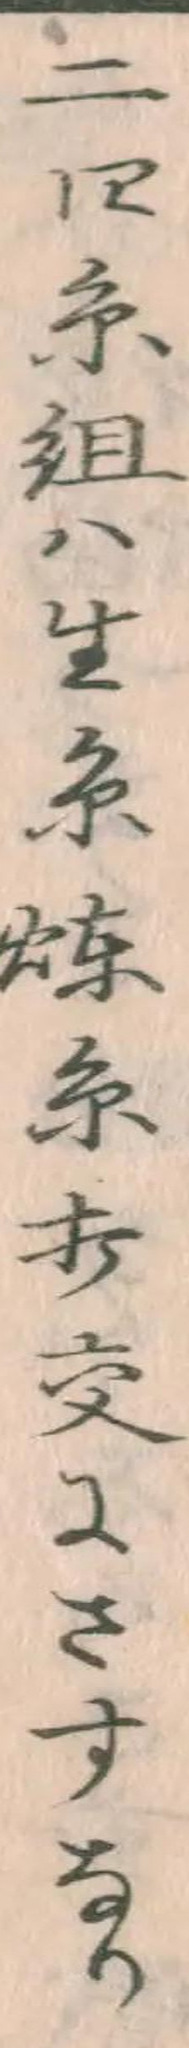二四糸組は生糸煉糸打交にさすなり
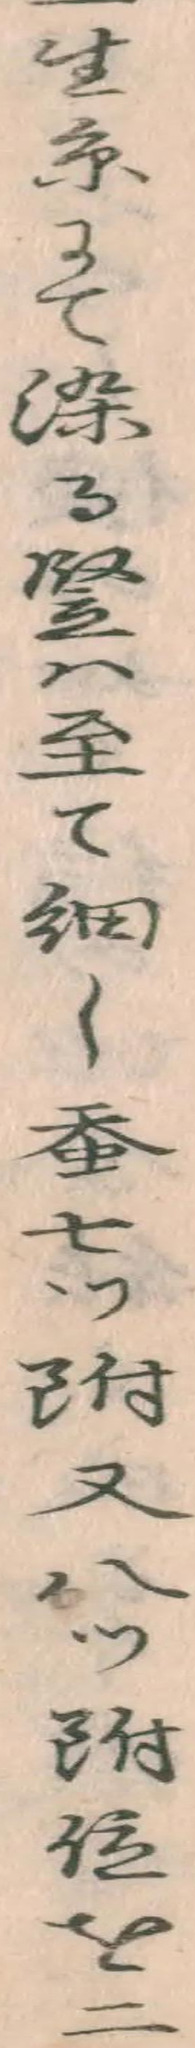一生糸にて染る竪は至て細し蚕七ッ附又八ッ附位を二
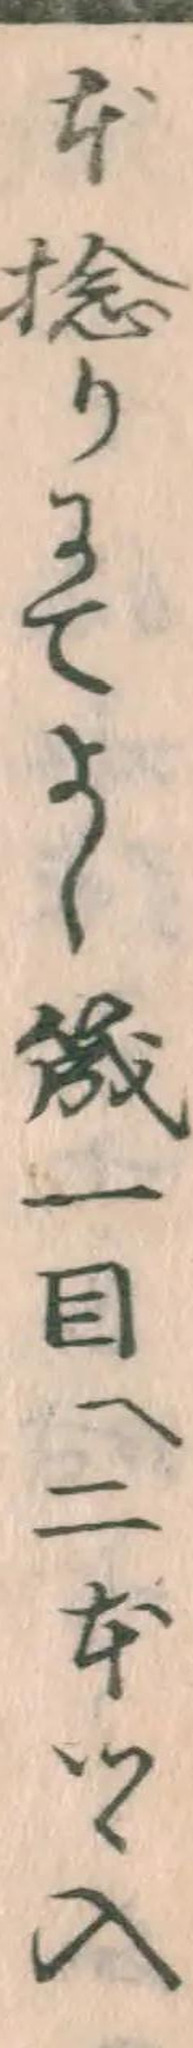本捻りにてよし筬一目へ二本つゝ入
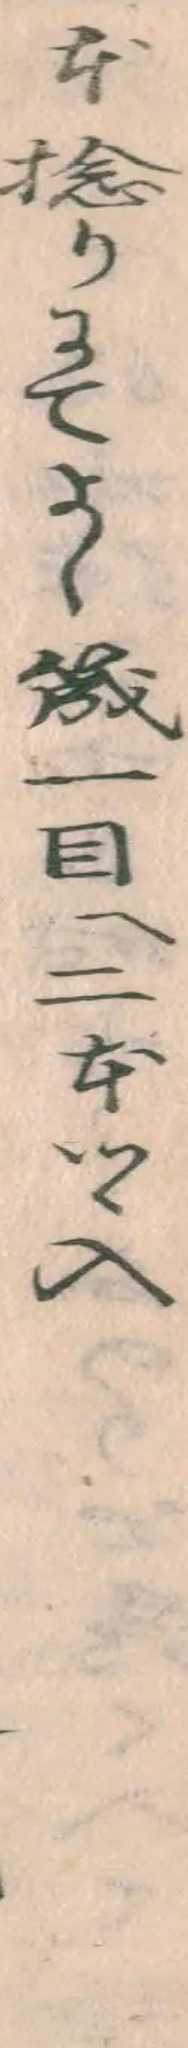本捻りにてよし筬一目へ二本つゝ入
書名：機織彙編 5巻. [2]
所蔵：国立国会図書館 National Diet Library, JAPAN
